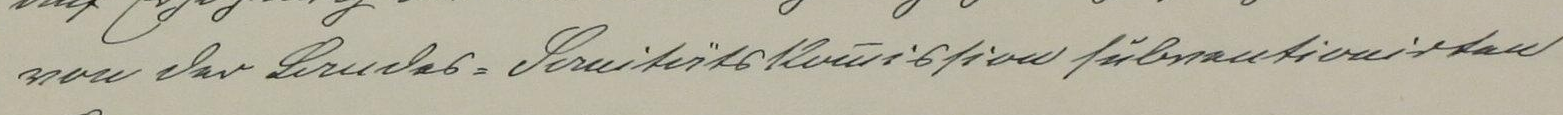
von der Landes-Sanitätskommission subventionirten
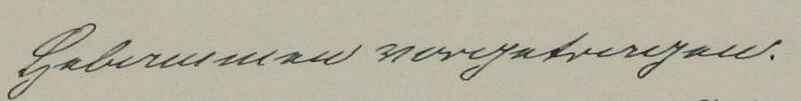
Hebammen vorgetragen.
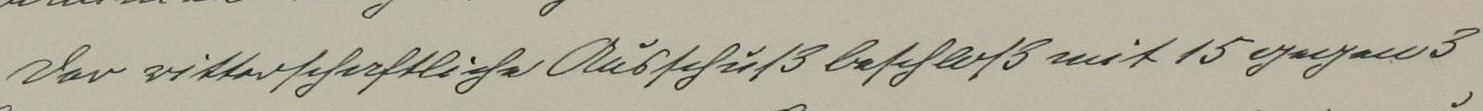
Der ritterschaftliche Ausschuß beschloß mit 15 gegen 3
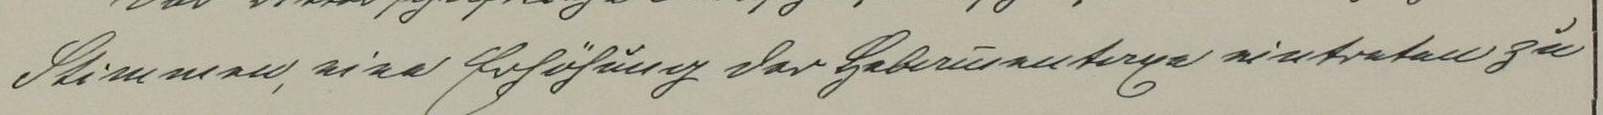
Stimmen, eine Erhöhung der Hebammentaxe eintreten zu
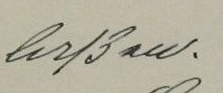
laßen.
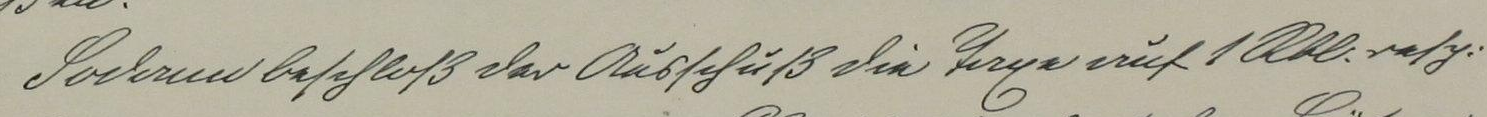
Sodann beschloß der ritterschaftliche Ausschuß die Taxe auf 1 Rbl. resp.
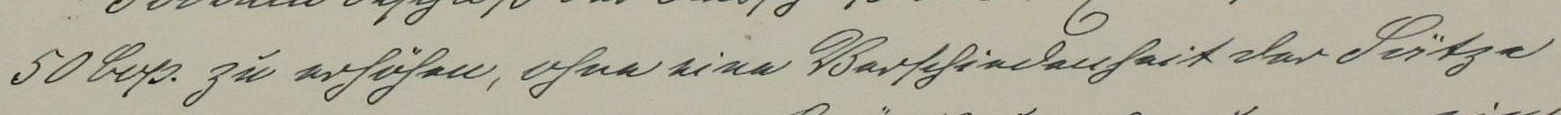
50 Cop. zu erhöhen, ohne eine Verschiedenheit der Sätze
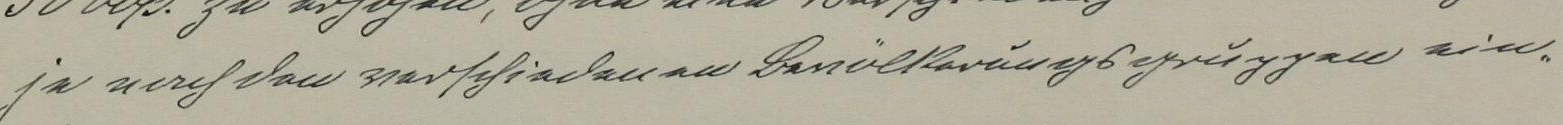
je nach den verschiedenen Bevölkerungsgruppen ein-
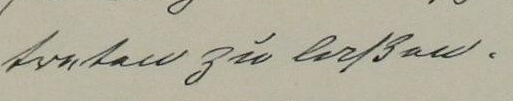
treten zu laßen.
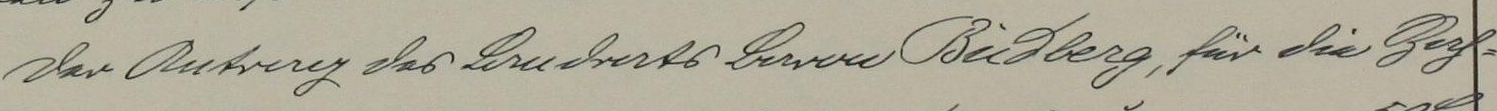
Der Antrag des Landrats Baron Budberg, für die Zah-
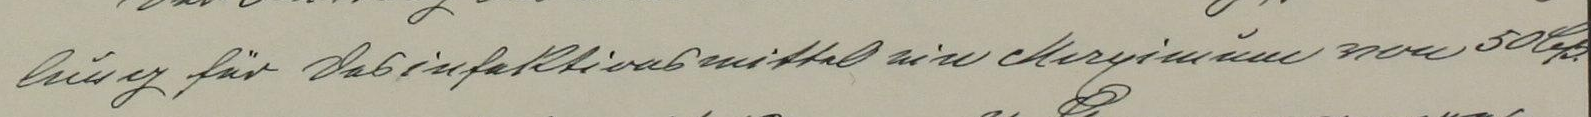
lung für Desinfektionsmittel ein Maximum von 50 Cop.
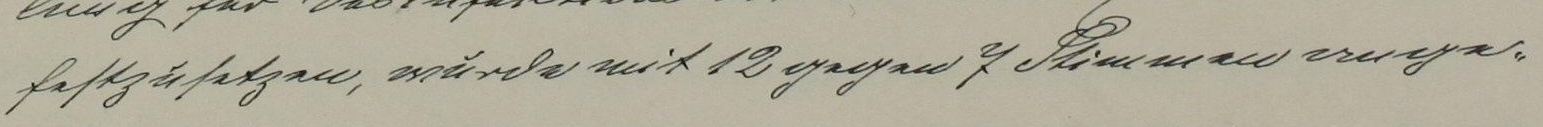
festzusetzen, wurde mit 12 gegen 7 Stimmen ange-
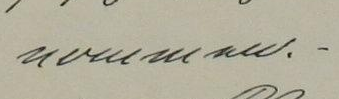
nommen.
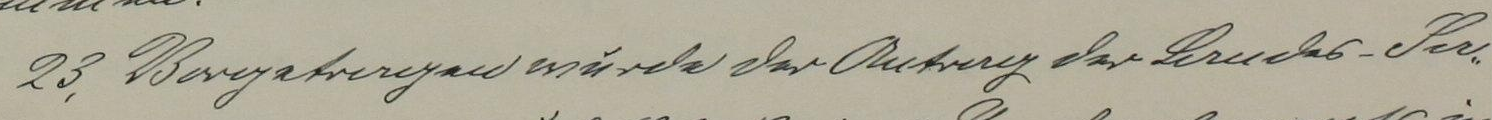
23. Vorgetragen wurde der Antrag der Landes-Sa-
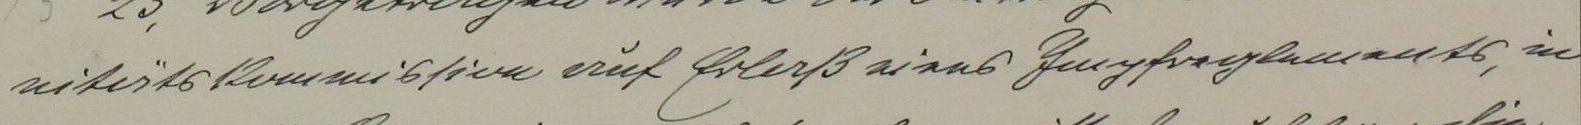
nitätskommission auf Erlaß eines Impfreglements, in
